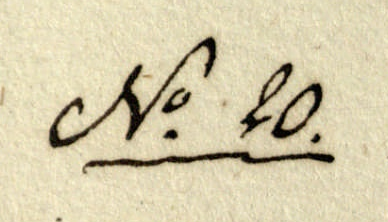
No 20.
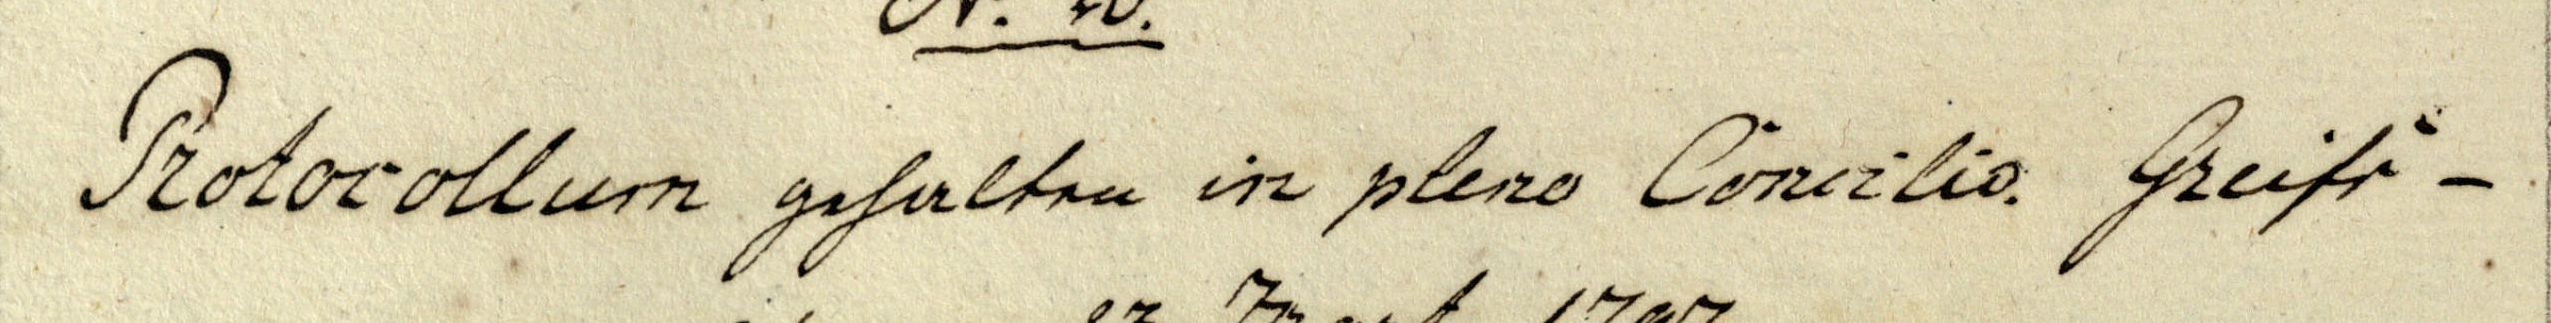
Protocollum gehalten in pleno Concilio. Greifs¬
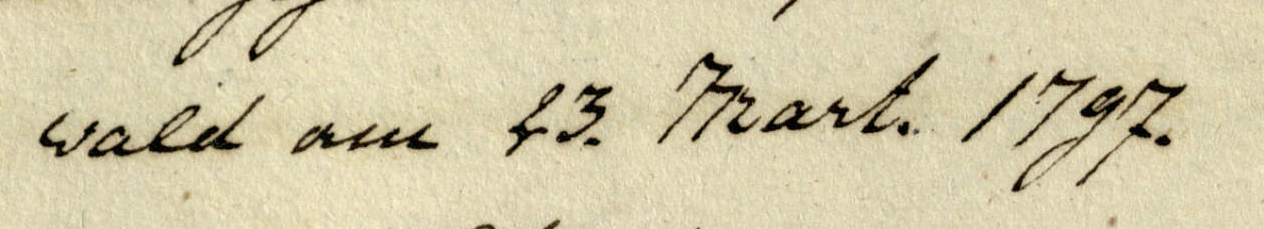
wald am 23. Mart. 1797.
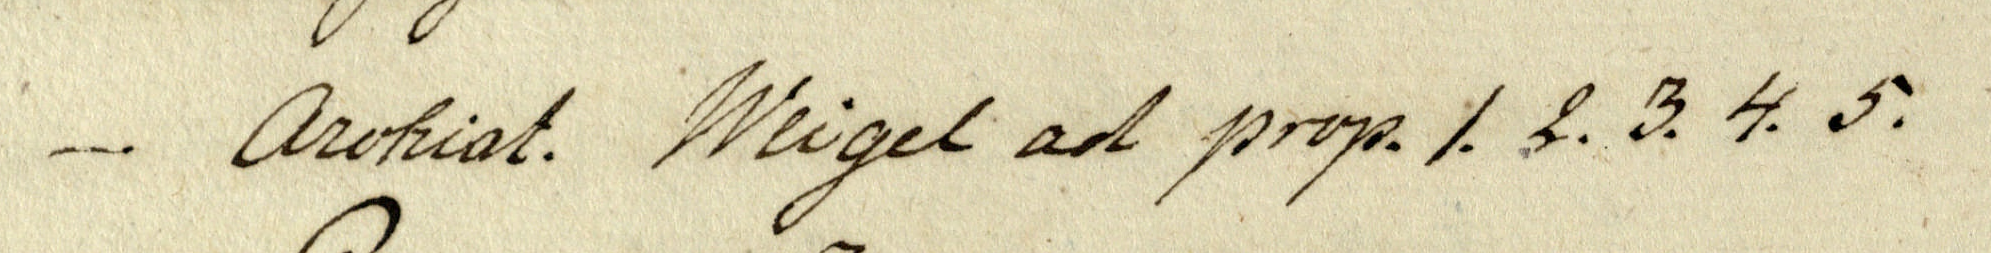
Archiat. Weigel ad prop. 1. 2. 3. 4. 5.
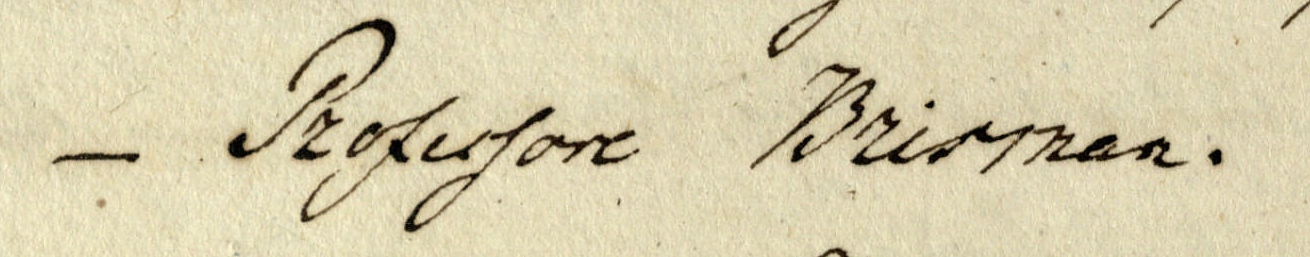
Professore Brisman.
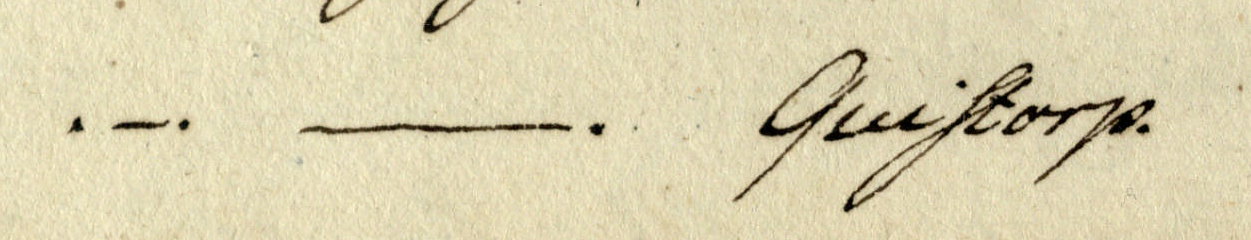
Quistorp.
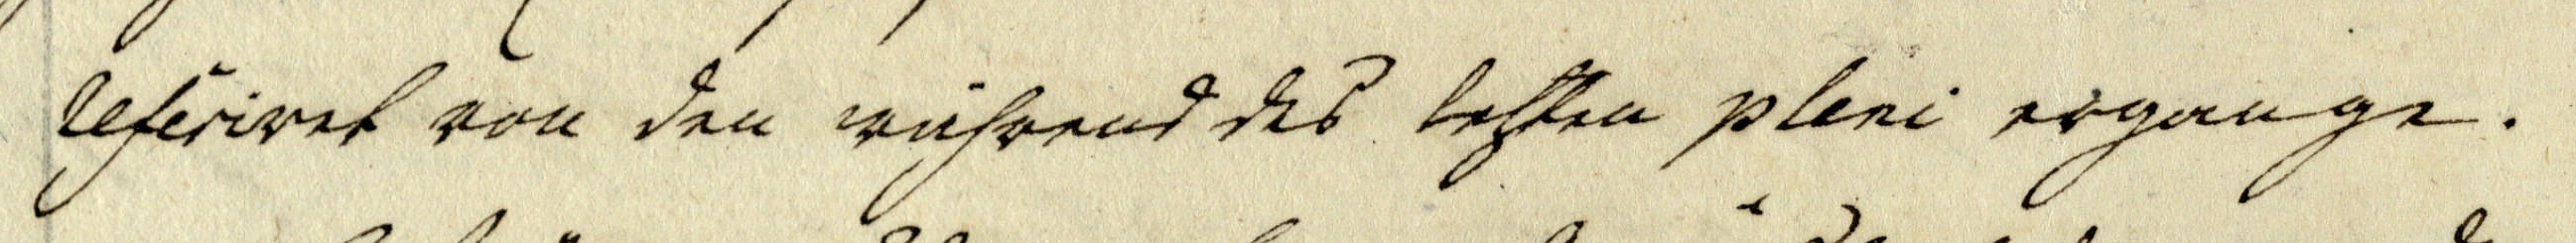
Referiret von den während des letzten pleni ergange¬
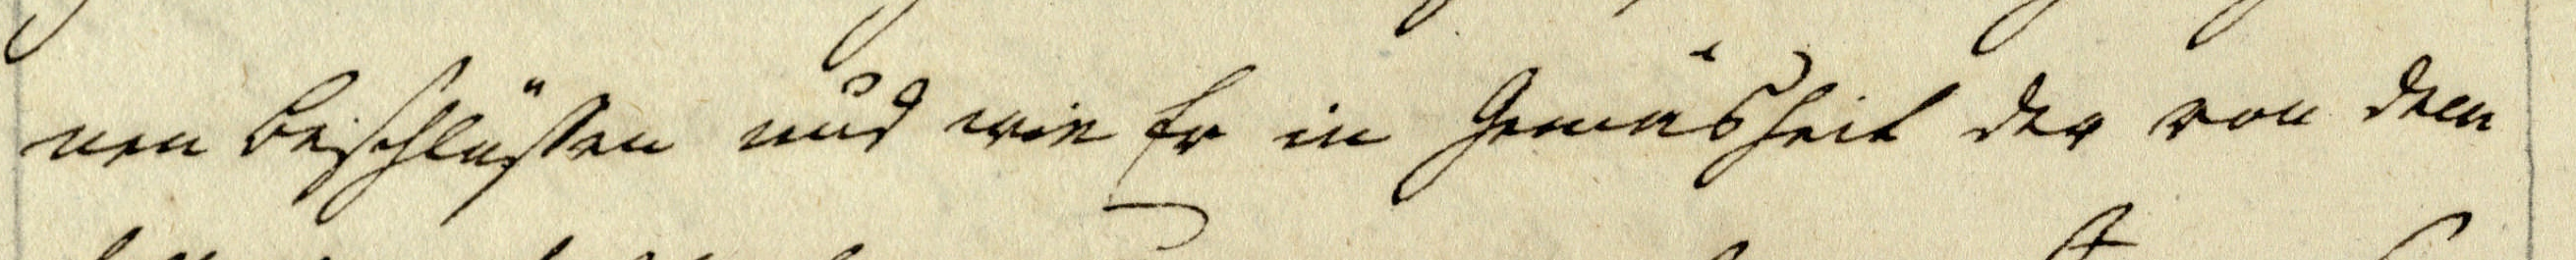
nen Beschlüssen und wie Er in Gemäsheit der von dem
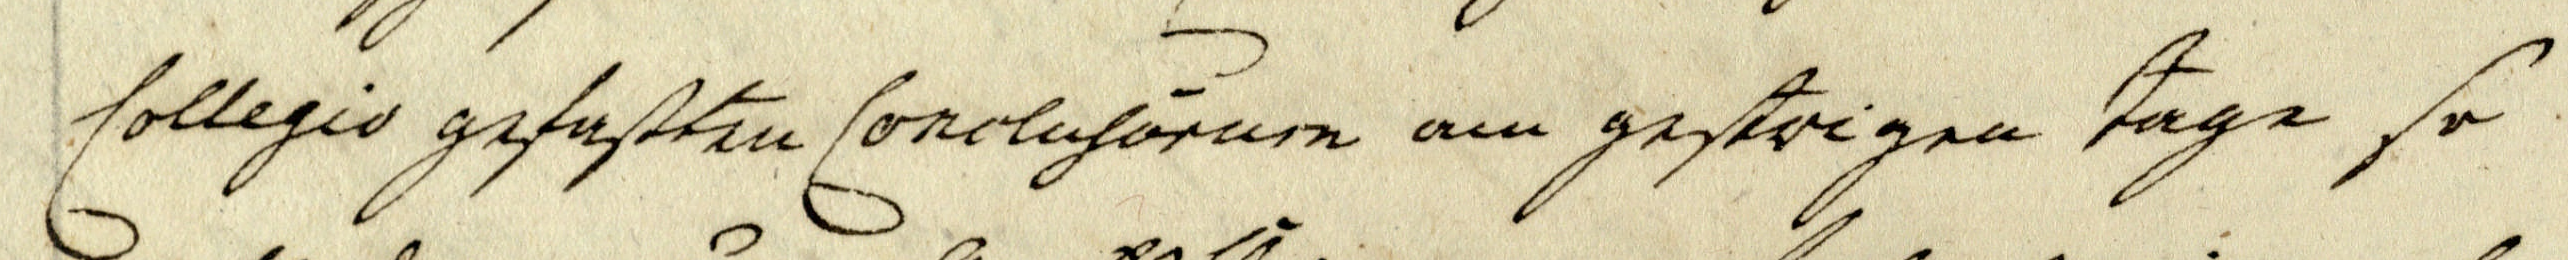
Collegio gefaßten Conclusorum am gestrigen Tage so
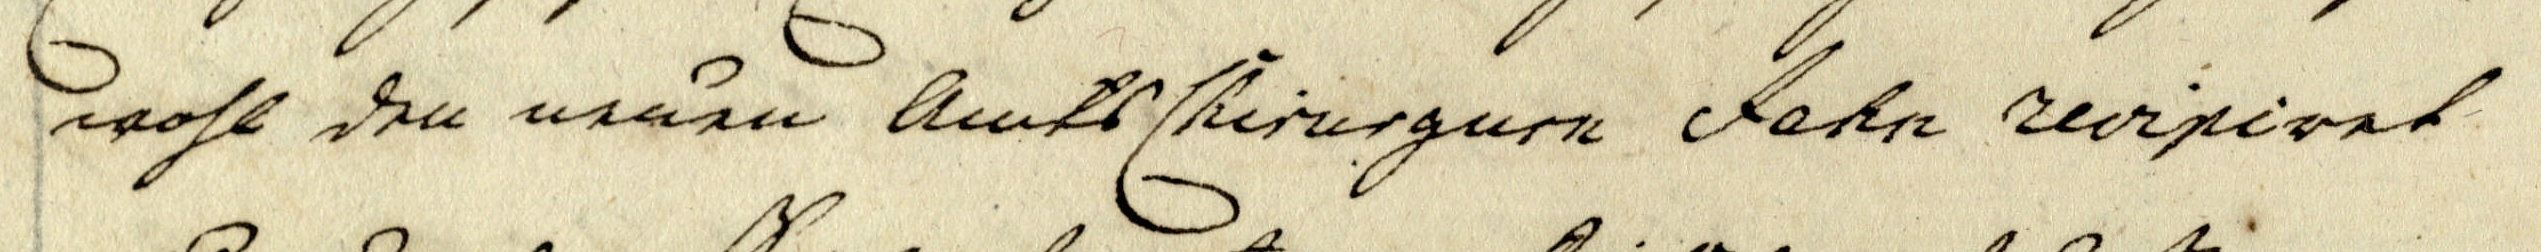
wohl den neuen AmtsChirurgum Jahn recipiret
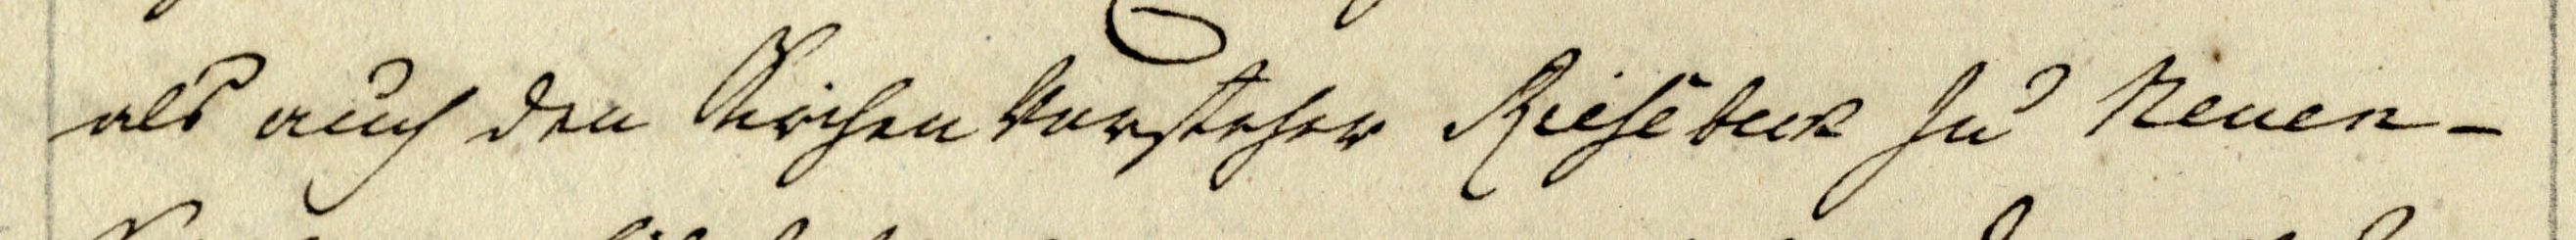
als auch den Kirchen Vorsteher Riesebeck zu Neuen¬
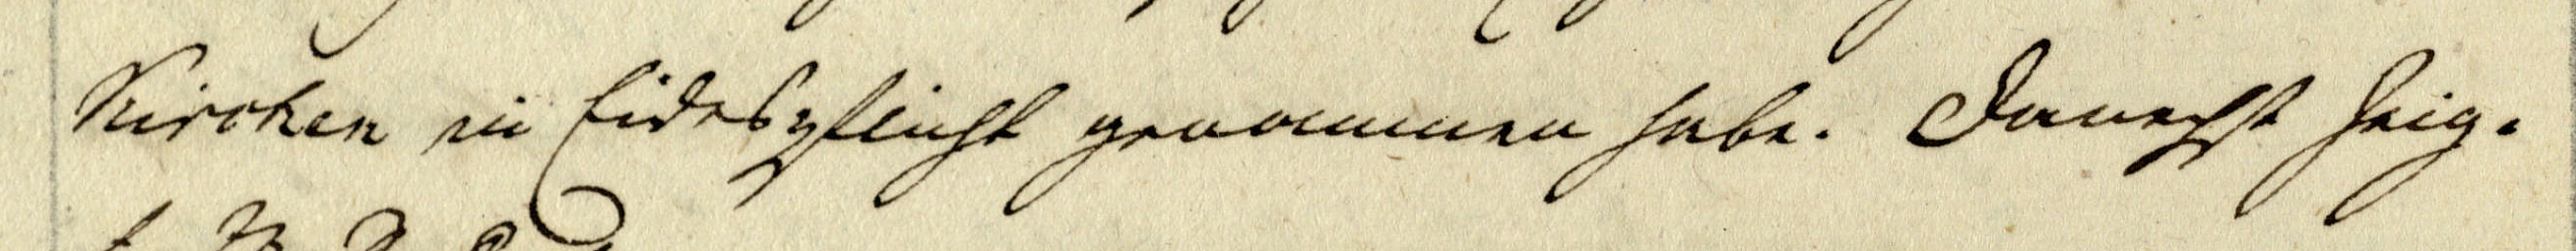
Kirchen in Eidespflicht genommen habe. Danechst zeig¬
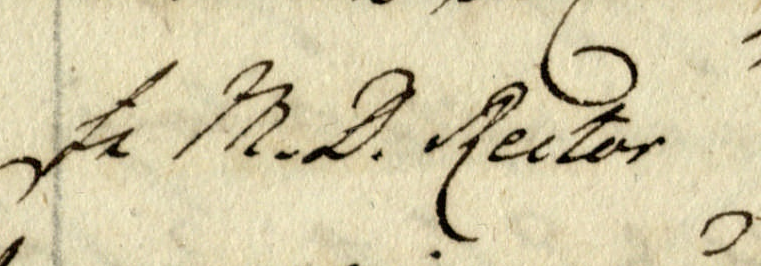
te M. D. Rector
